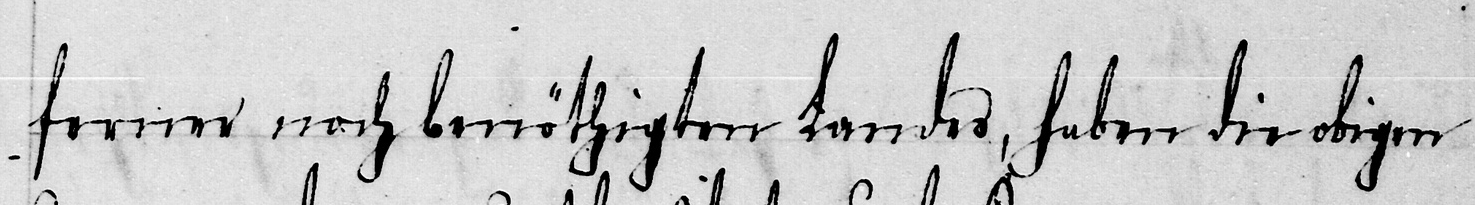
ferner noch benöthigten Landes, haben die obigen
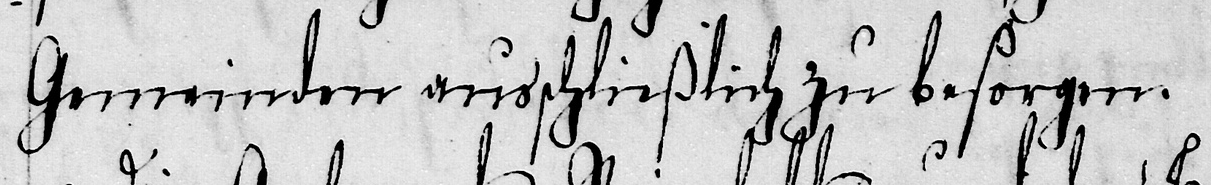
Gemeinden ausschließlich zu besorgen.
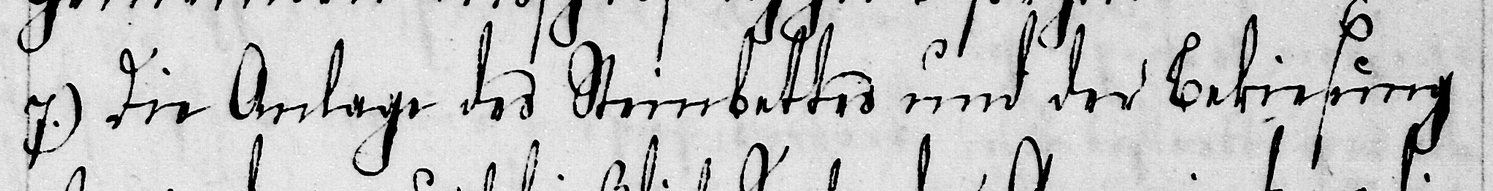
7.) Die Anlage des Steinbettes und der Bekiesung
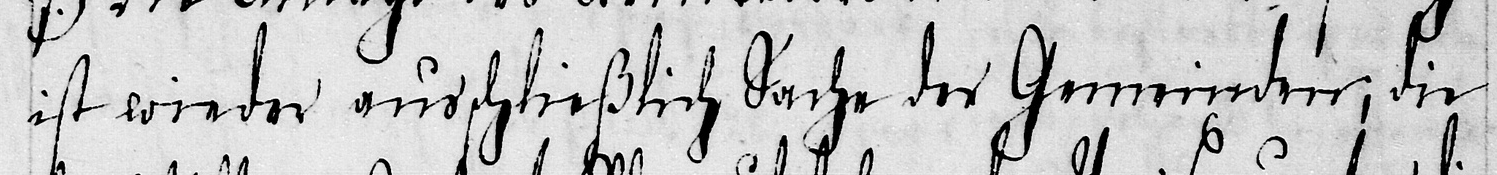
ist wieder ausschließlich Sache der Gemeinden, die
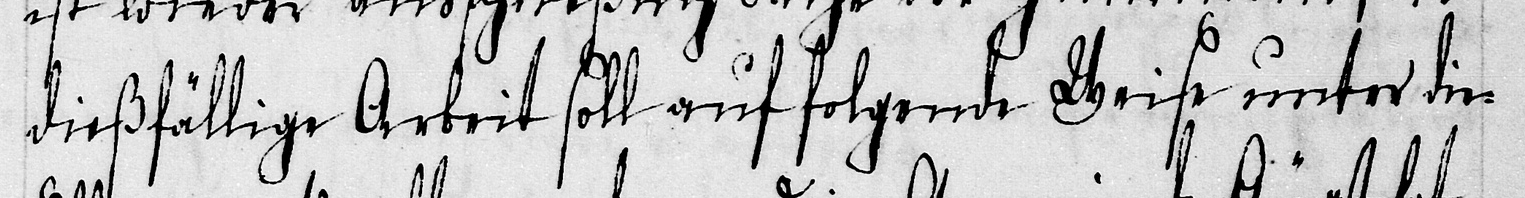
dießfällige Arbeit soll auf folgende Weise unter die¬
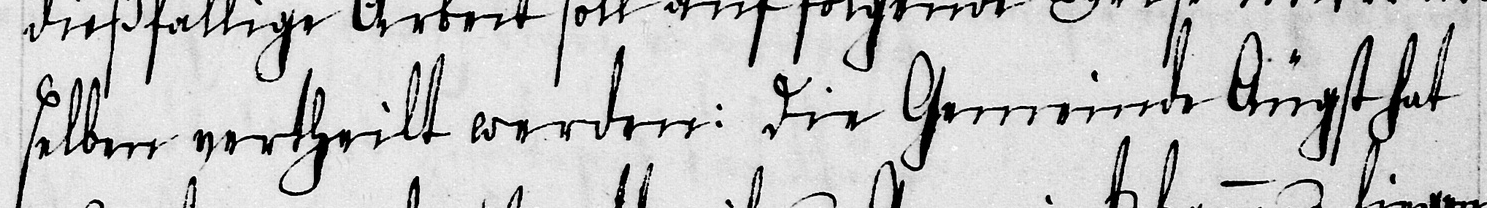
selben vertheilt werden: Die Gemeinde Äugst hat
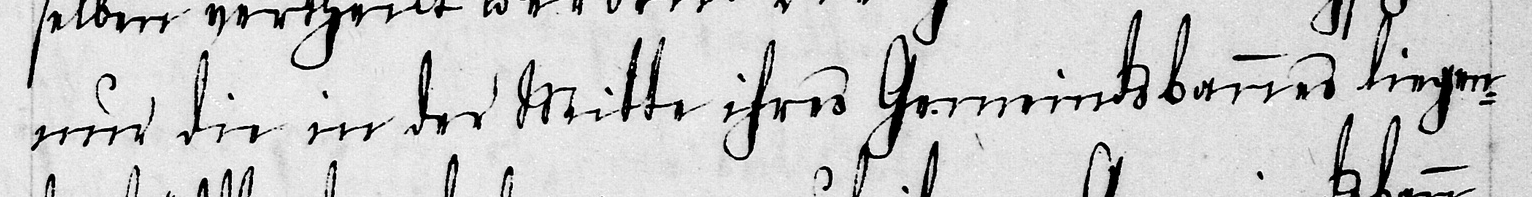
nur die in der Mitte ihres Gemeindsbannes liegen¬
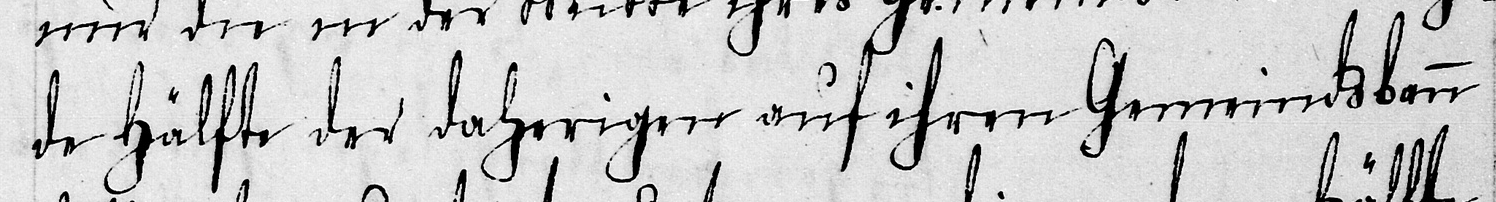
de Hälfte der daherigen auf ihren Gemeindsbann
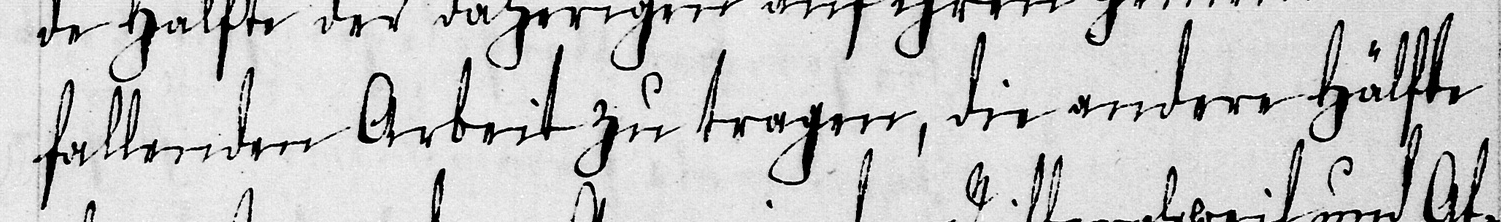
fallenden Arbeit zu tragen, die andere Hälfte
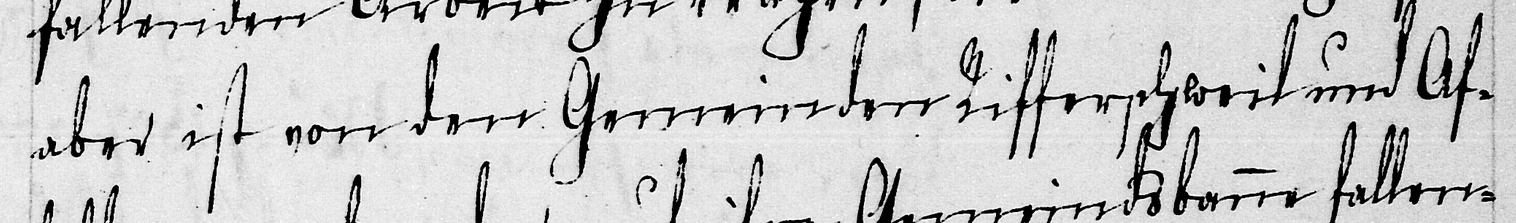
aber ist von den Gemeinden Rifferschweil und Af¬
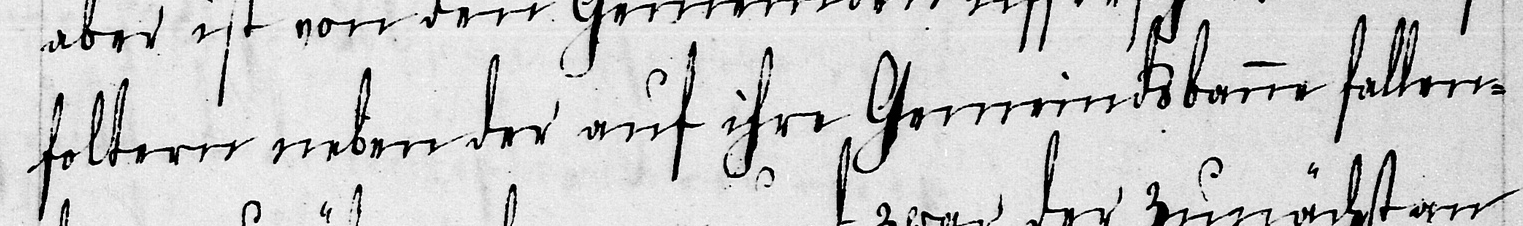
foltern neben der auf ihre Gemeindsbanne fallen¬
